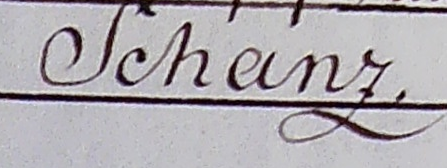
Schanz.
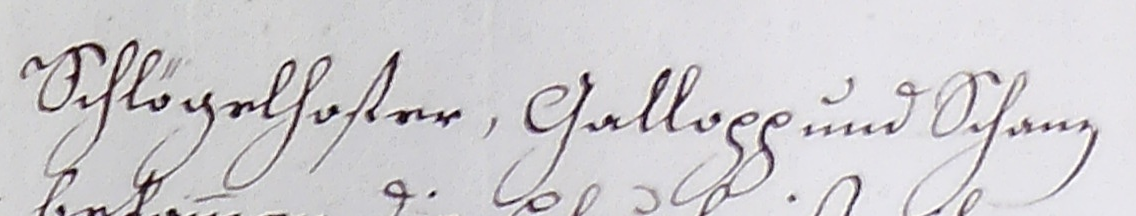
Schlögelhofer, Gallopp und Schanz
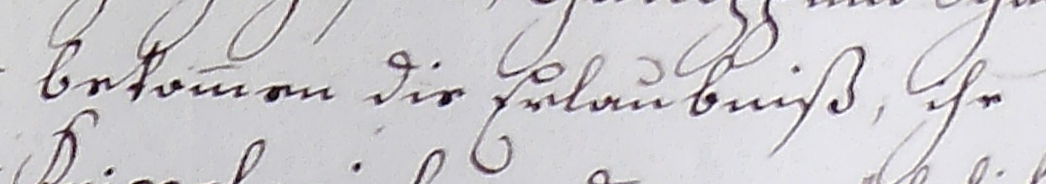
bekom̅en die Erlaubniß, ihr
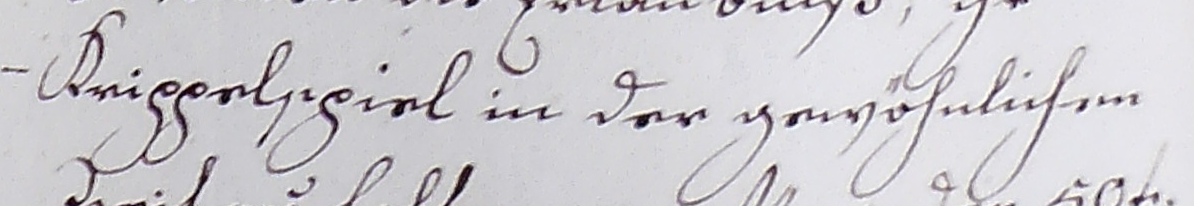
Krippelspiel in der gewöhnlichen
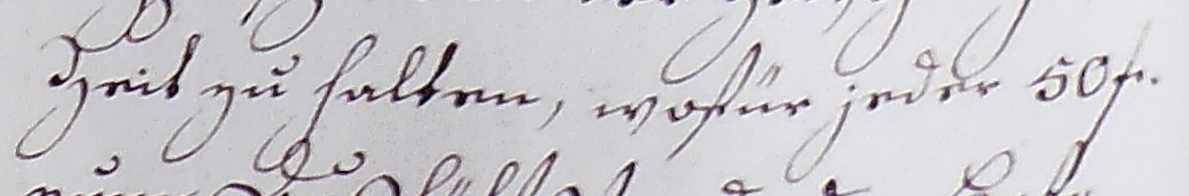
Zeit zu halten, wofür jeder 50fr.
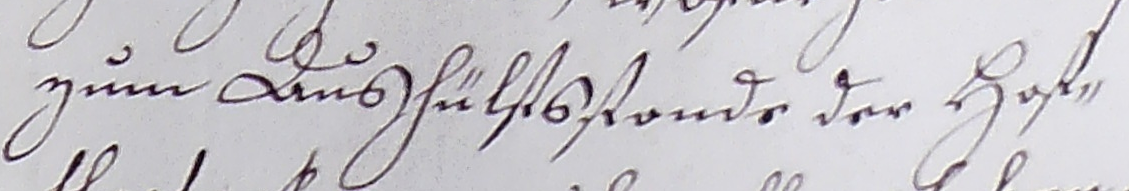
zum Aushülfsfonde der Hof¬
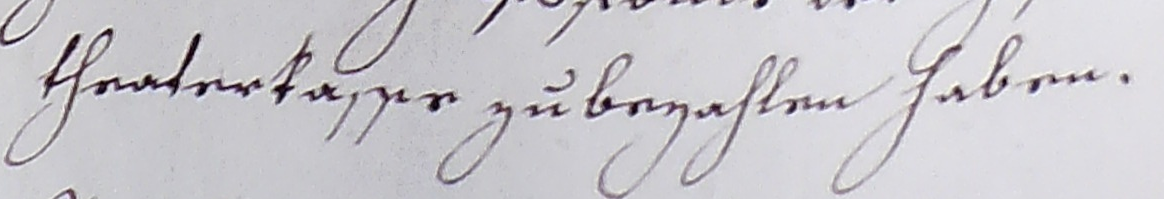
theaterkasse zubezahlen haben.
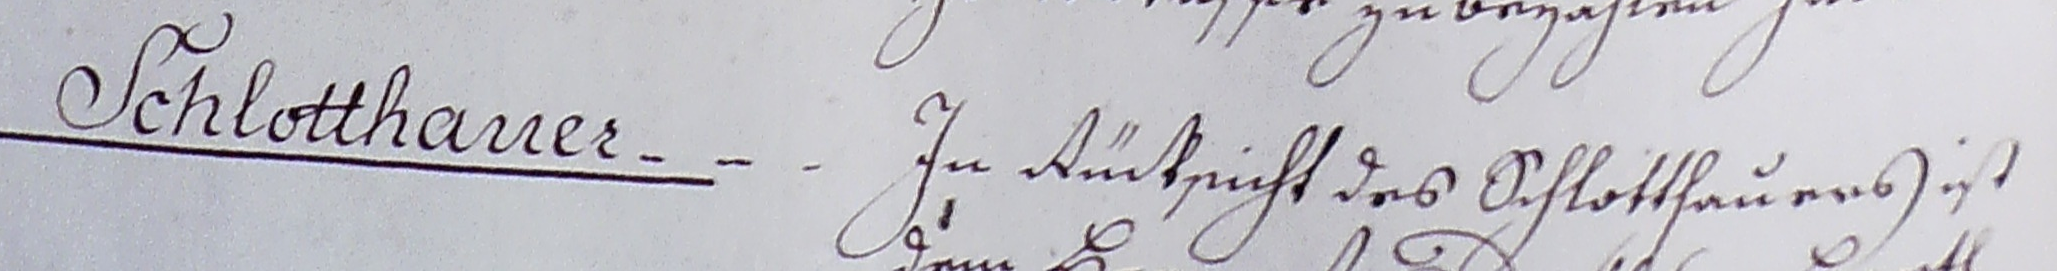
Schlotthauer .. .. . In Rücksicht des Schlotthauers ist
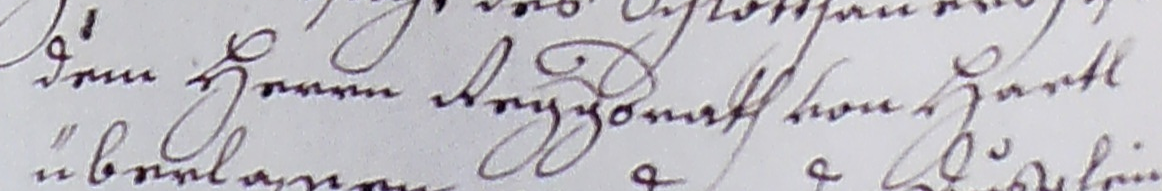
dem Herrn Reg͞gsrath von Hartl
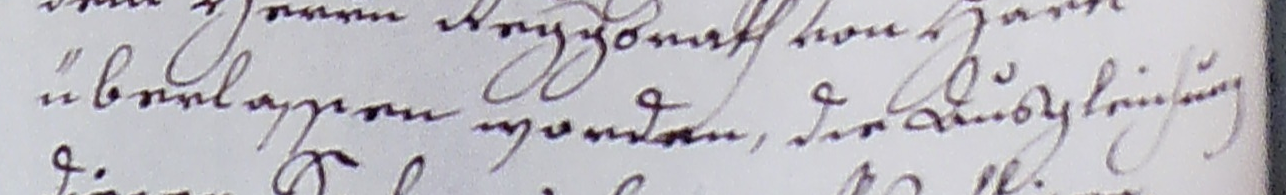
überlassen worden, die Ausgleichung
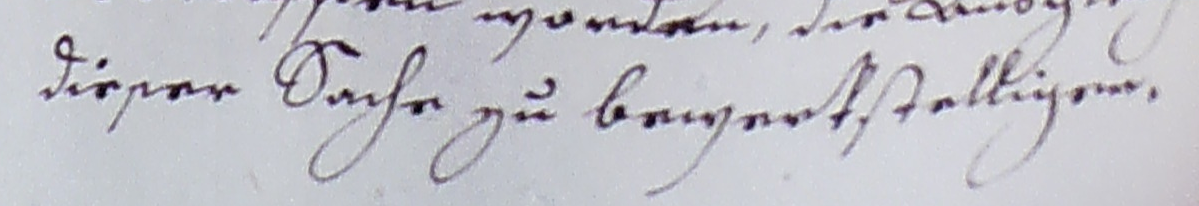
dieser Sache zu bewerkstelligen.
